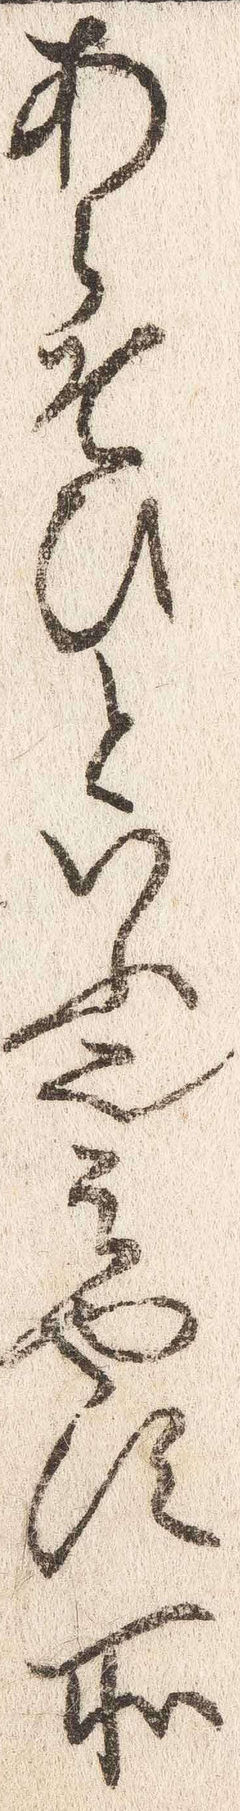あらそひといふ也みやす所

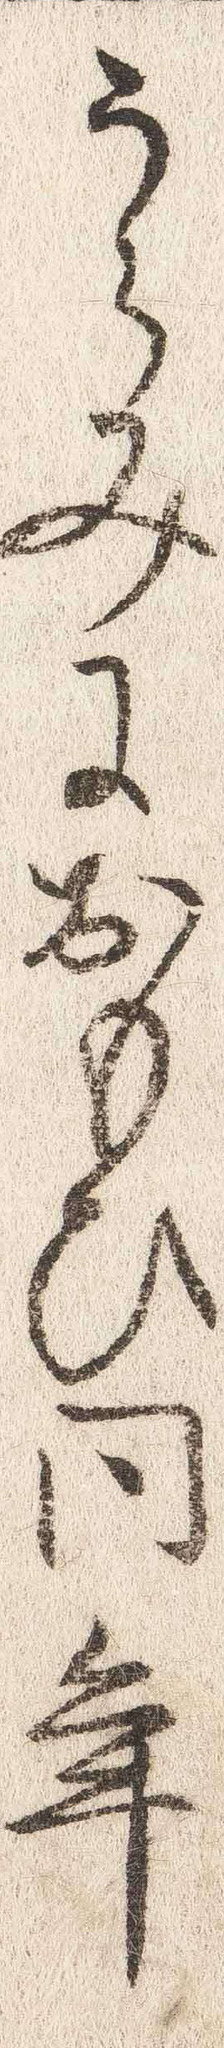うらみにおもひ同年
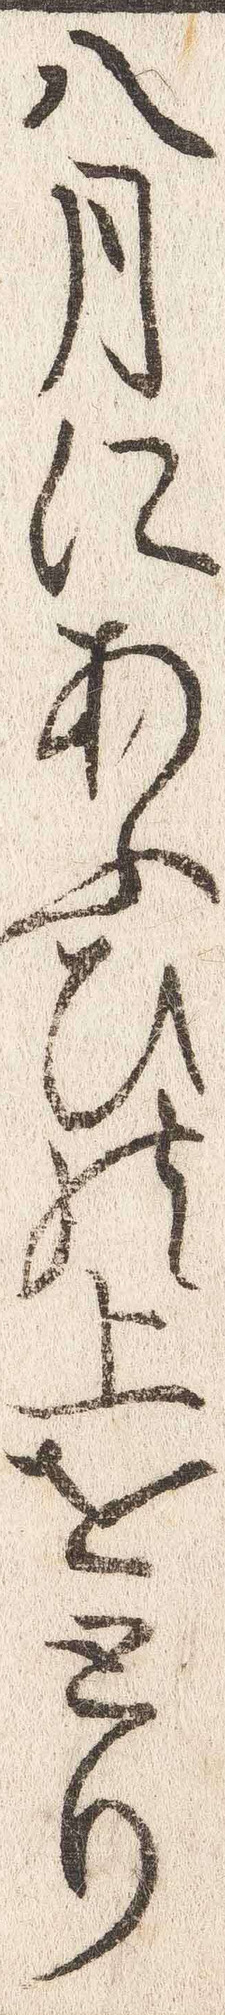八月にあふひの上をとり
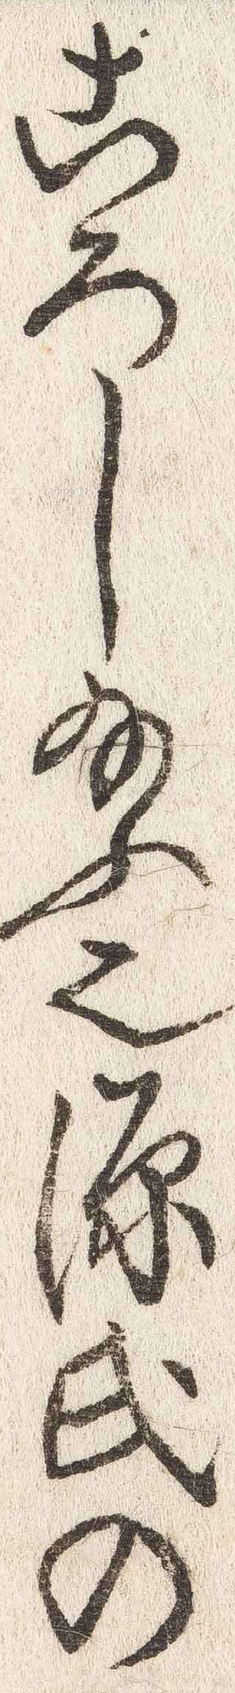ころし給ふ也源氏の
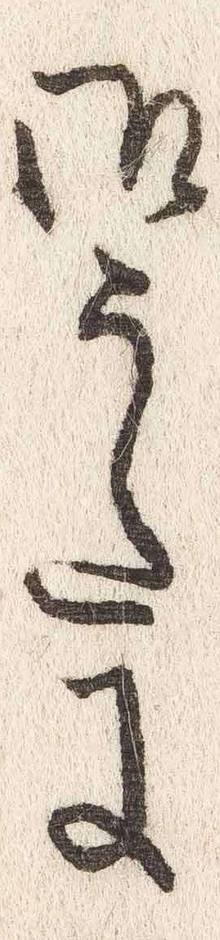御うたに
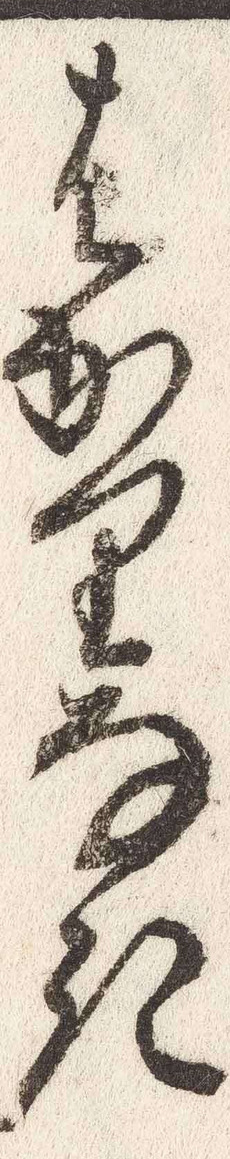はかりなき
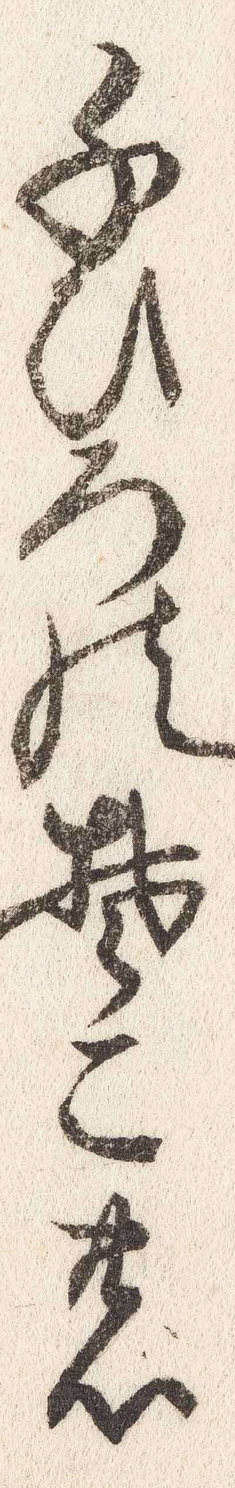千ひろのそこの
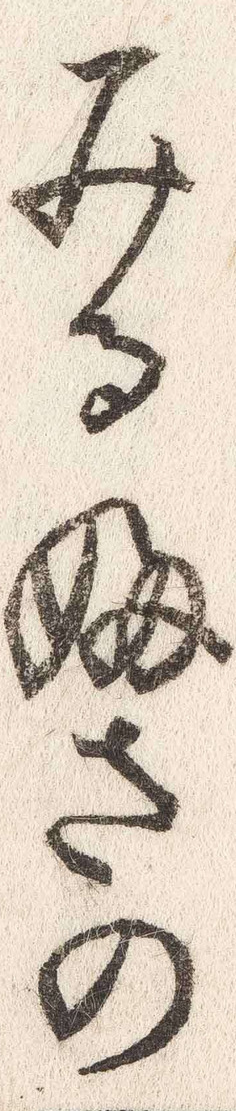みるふさの
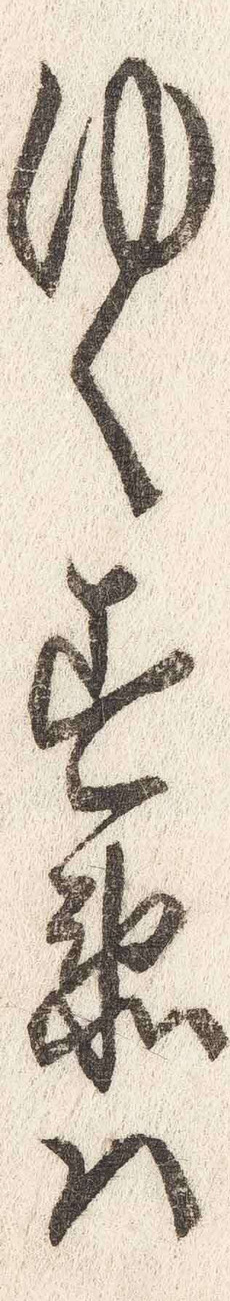ゆくすゑは
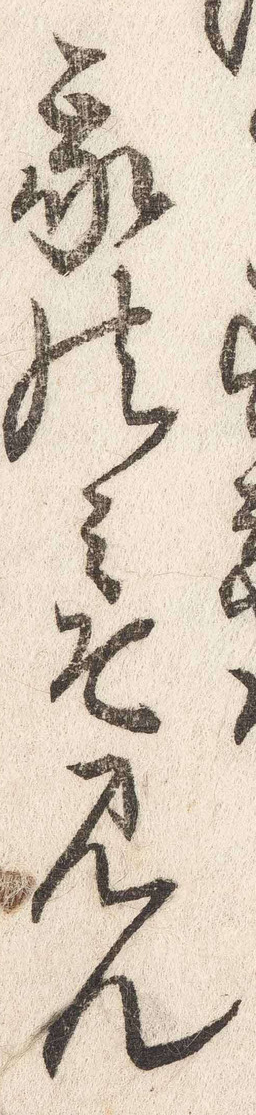我のみそ見ん

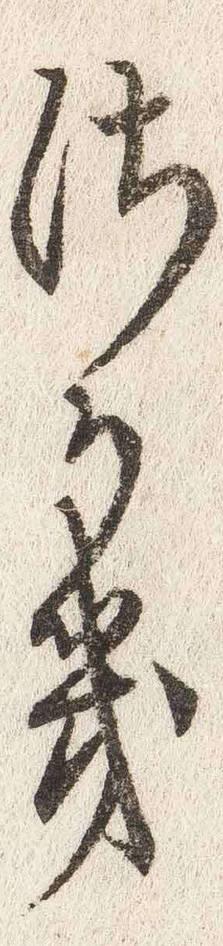さかき
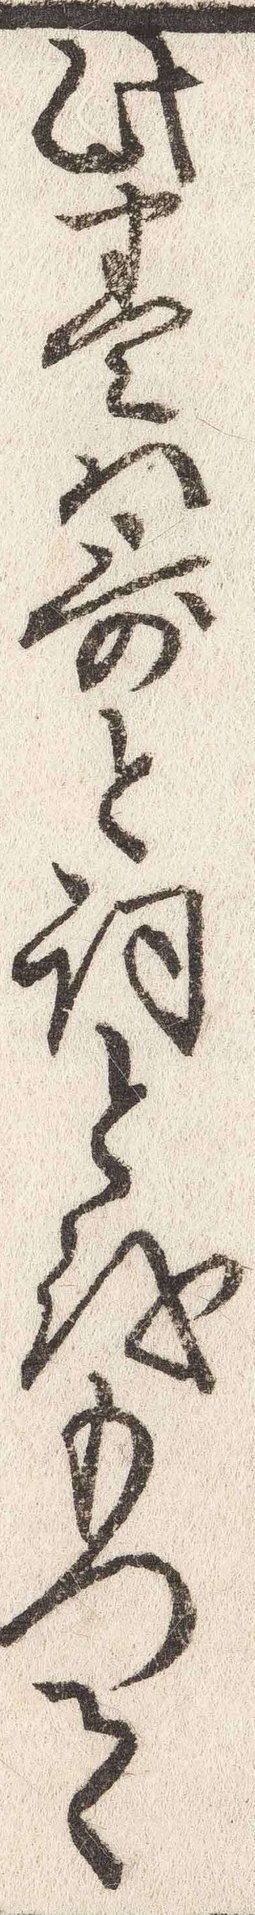此巻は歌と詞とをもつて
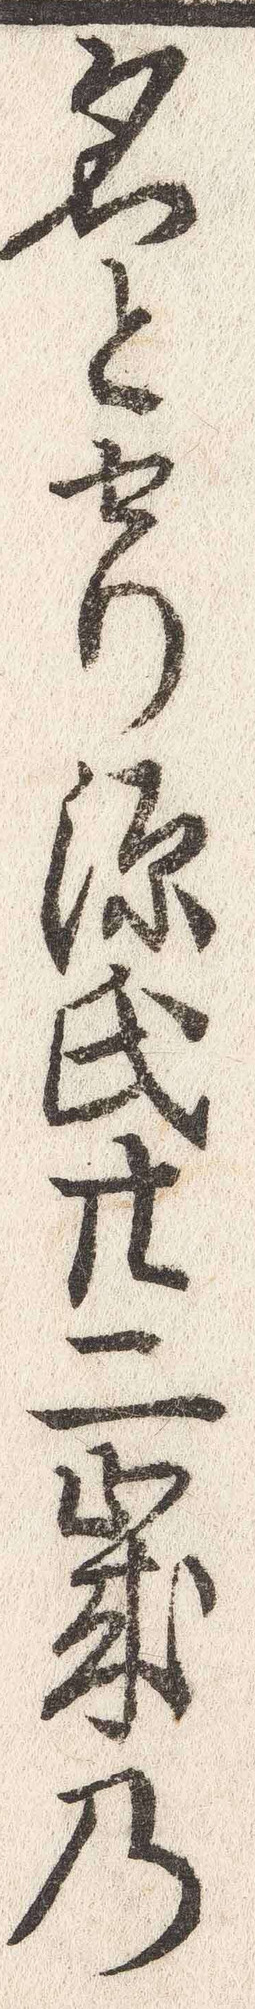名とせり源氏廿二歳の
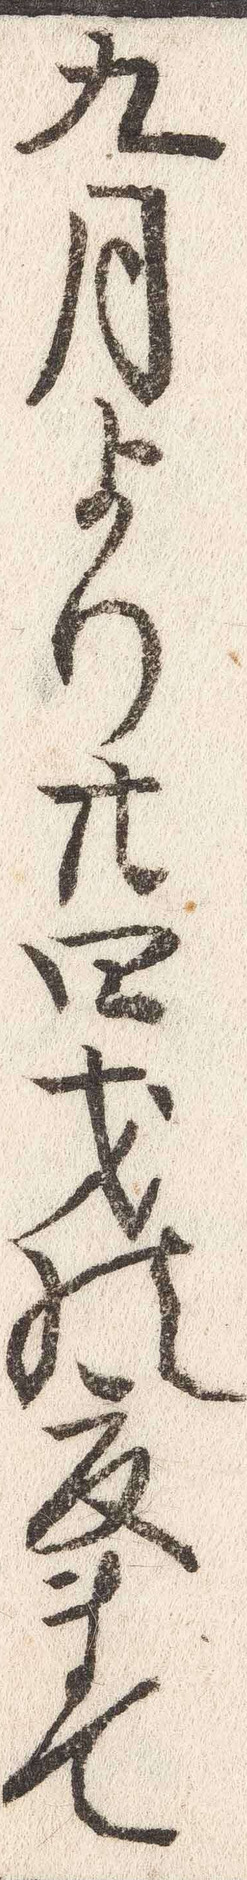九月より廿四才の夏まて
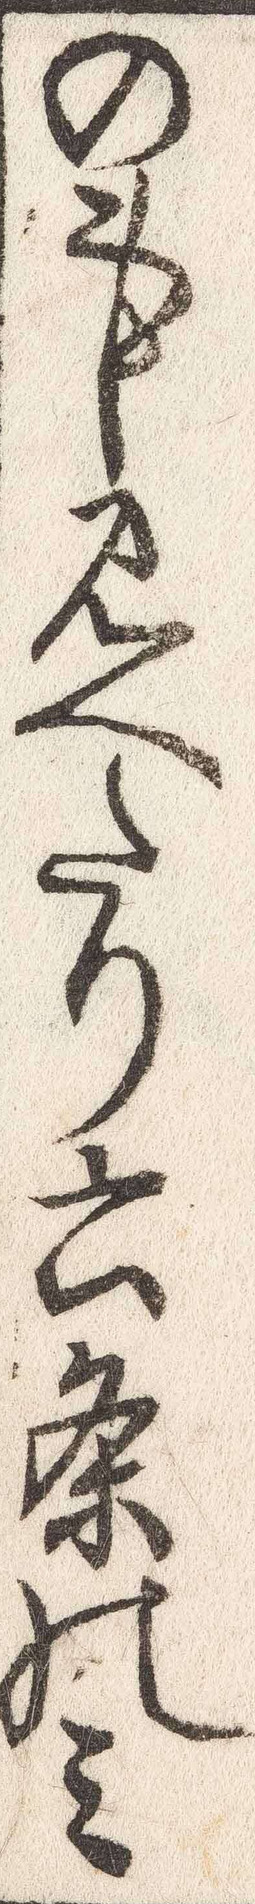の事見へたり六条のみ
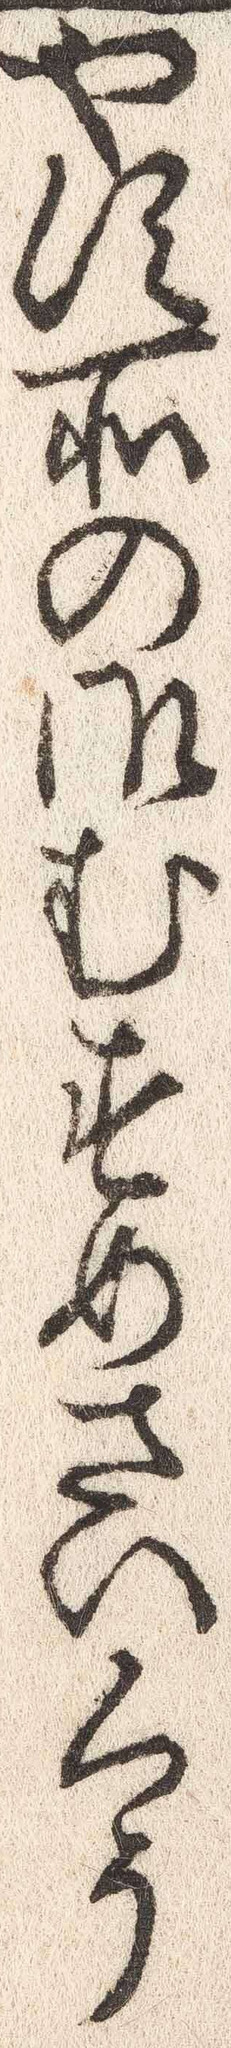やす所の御むすめさいくう
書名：源氏物語
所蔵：東京学芸大学附属図書館 国文学研究資料館
